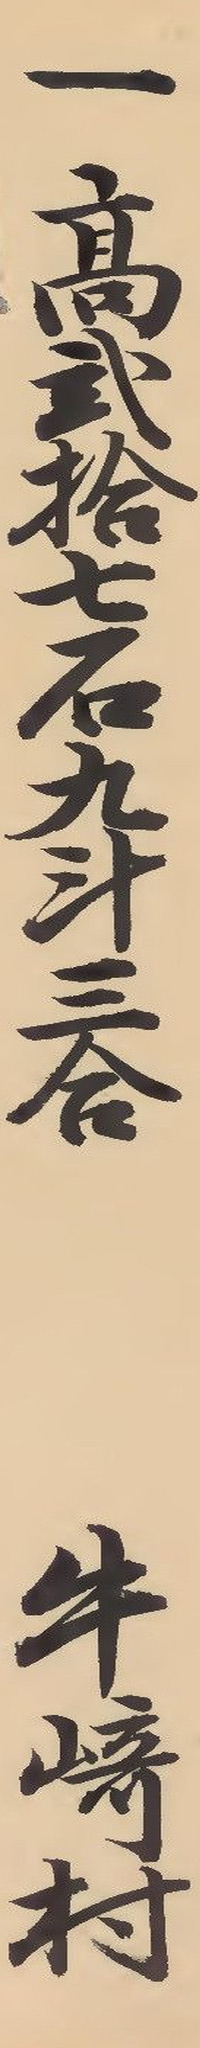一高弐拾七石九斗三合牛崎村
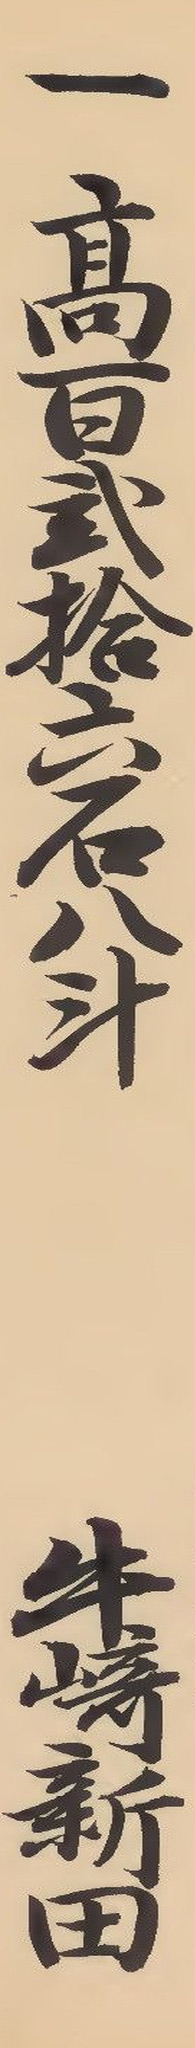一高百弐拾六石八斗牛崎新田
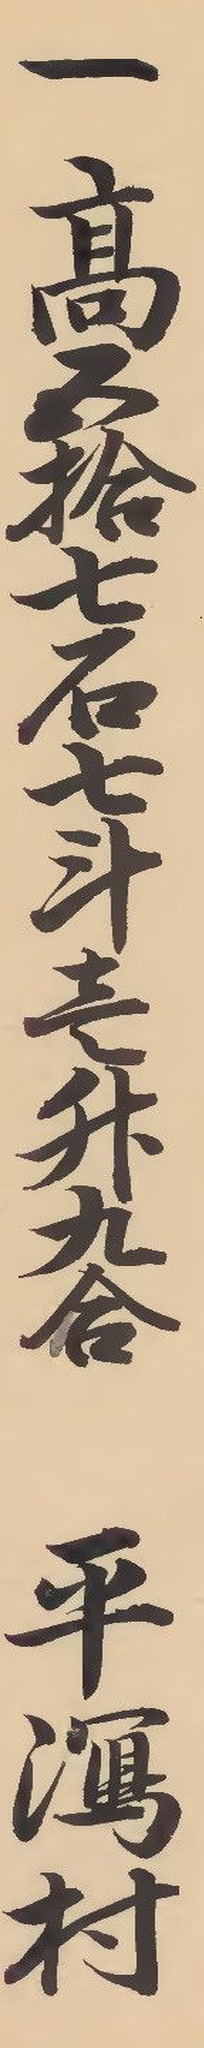一高五拾七石七斗壱升九合平潟村

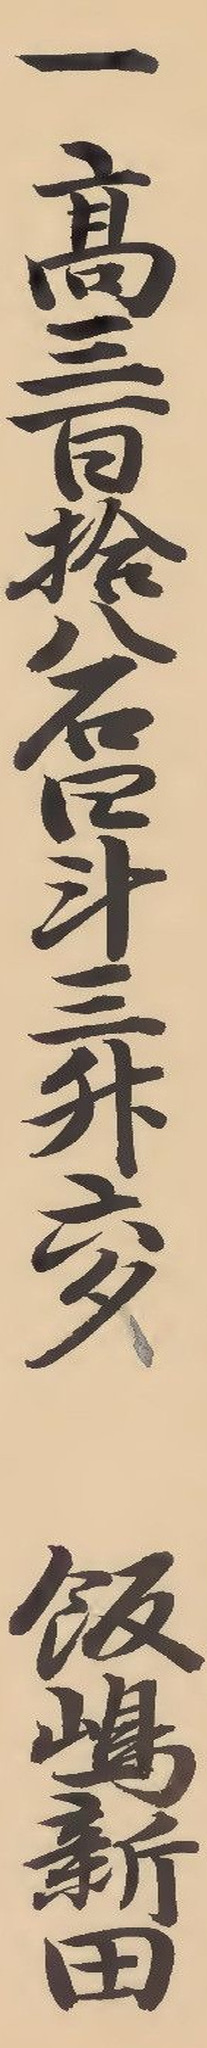一高三百拾八石四斗三升六勺飯島新田
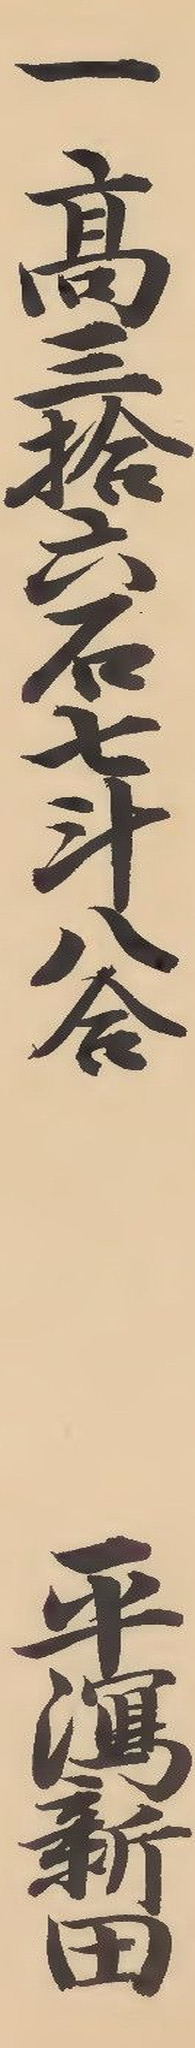一高三拾六石七斗八合平潟新田
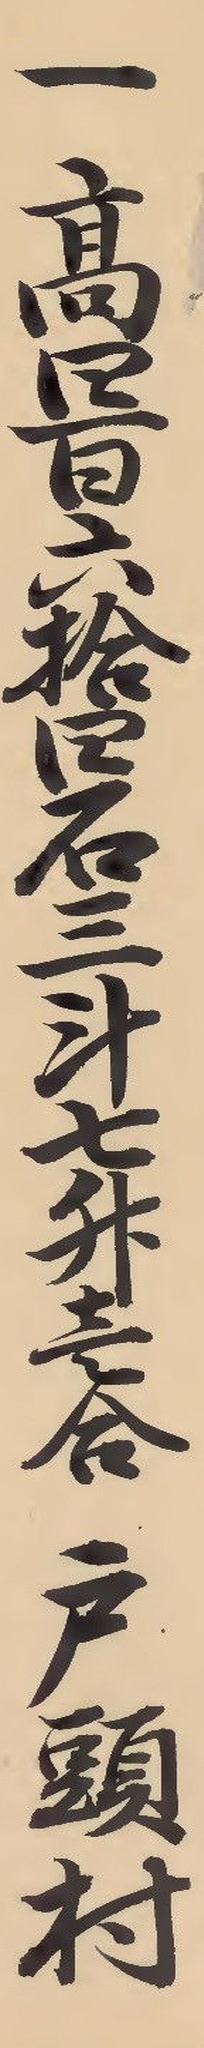一高四百六拾四石三斗七升壱合戸頭村
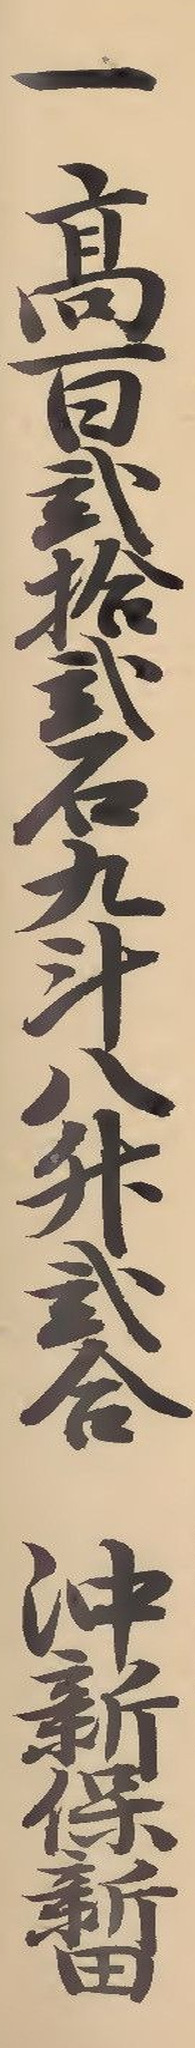一高百弐拾弐石九斗八升弐合沖新保新田
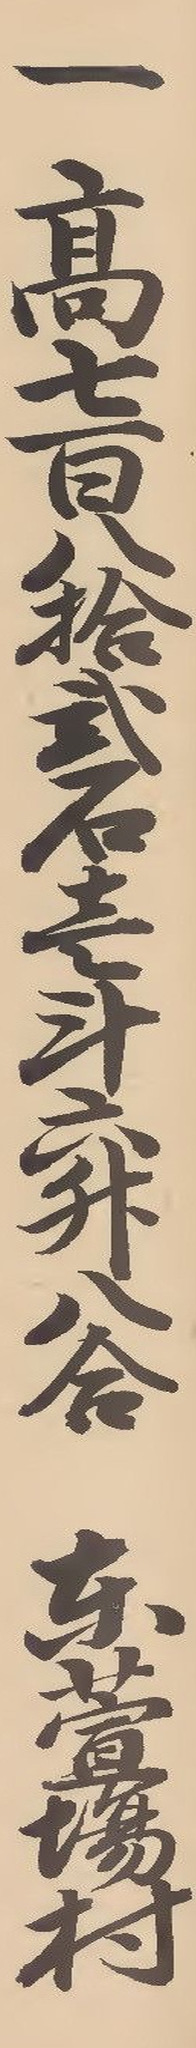一高七百八拾弐石壱斗六升八合東萱場村
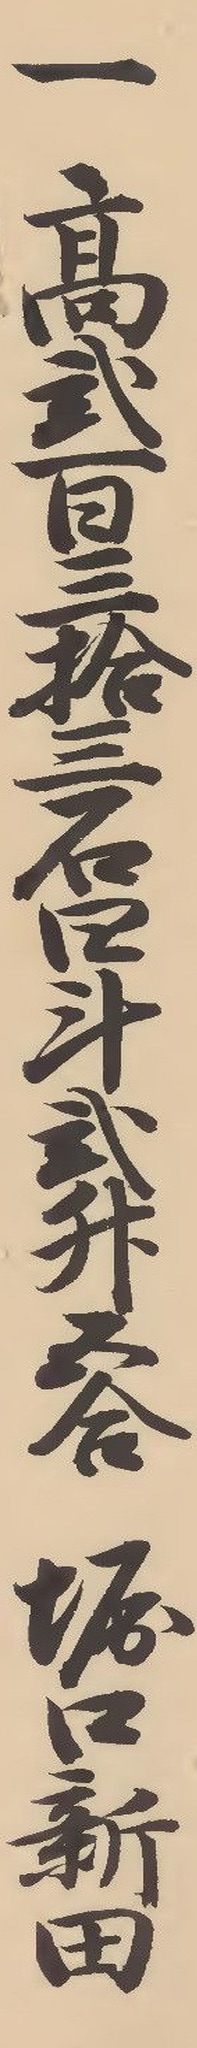一高弐百三拾三石四斗弐升五合堀口新田
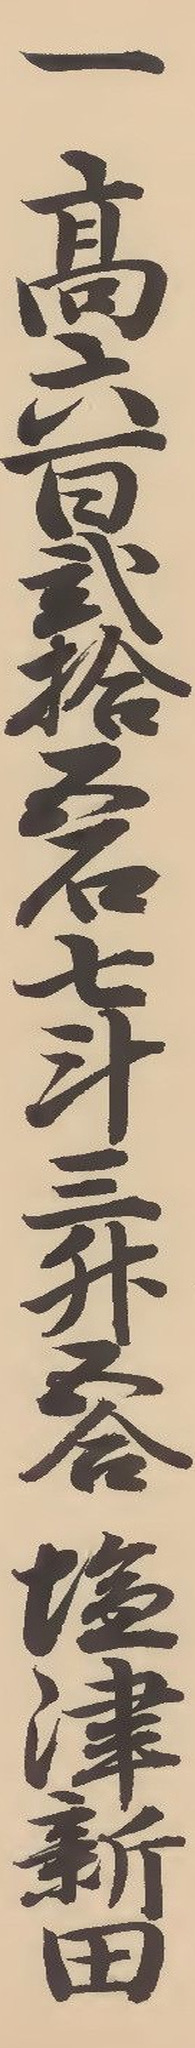一高六百弐拾五石七斗三升五合塩津新田
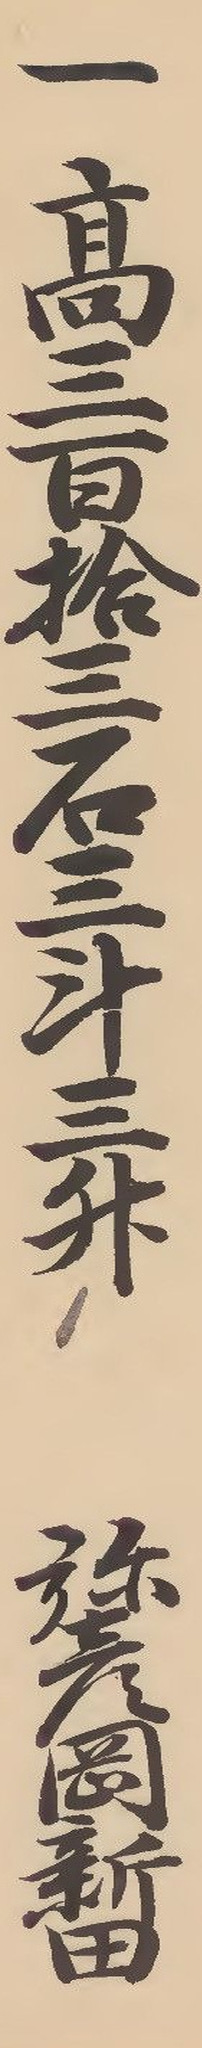一高三百拾三石三斗三升弥彦岡新田

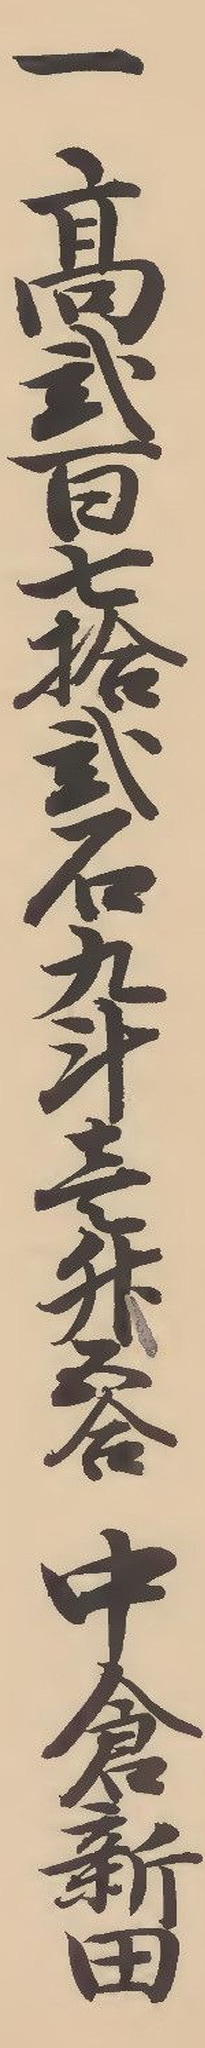一高弐百七拾弐石九斗壱升五合中倉新田
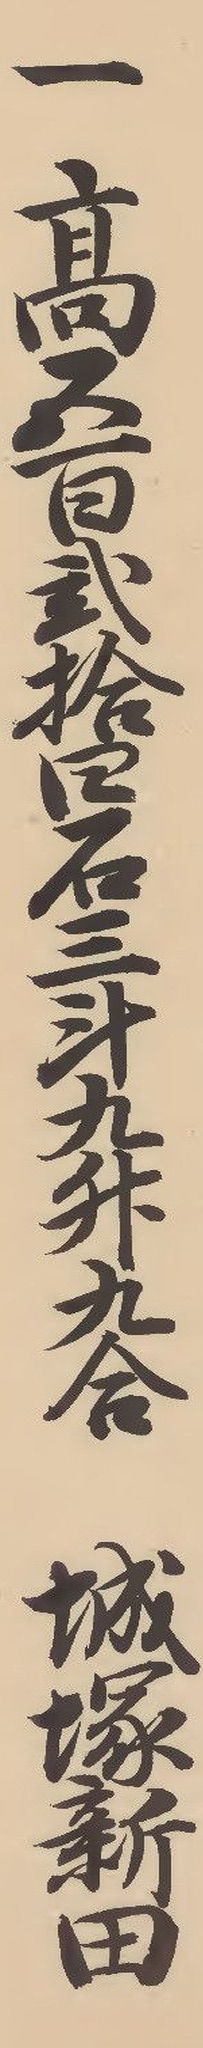一高五百弐拾四石三斗九升九合城塚新田
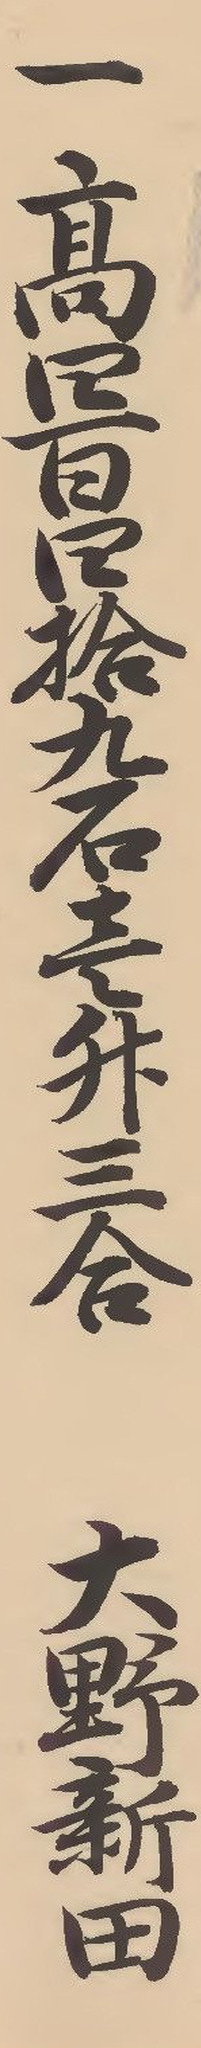一高四百四拾九石壱升三合大野新田
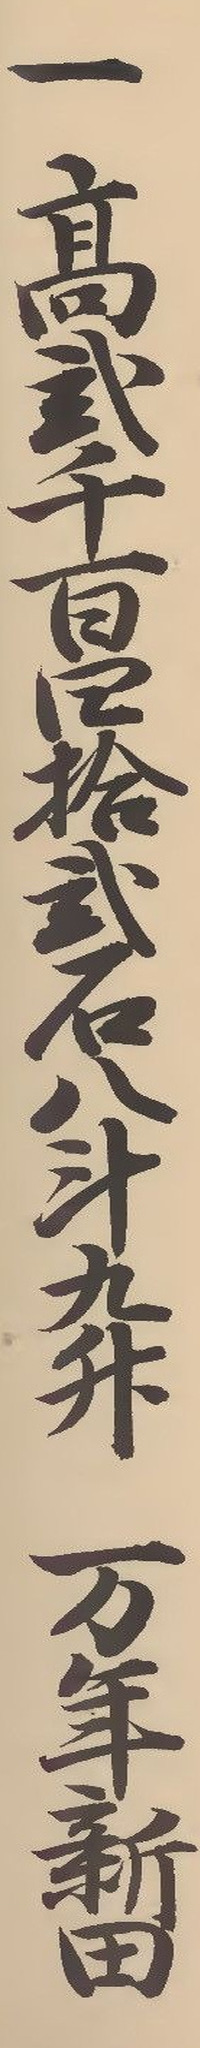一高弐千百四拾弐石八斗九升万年新田
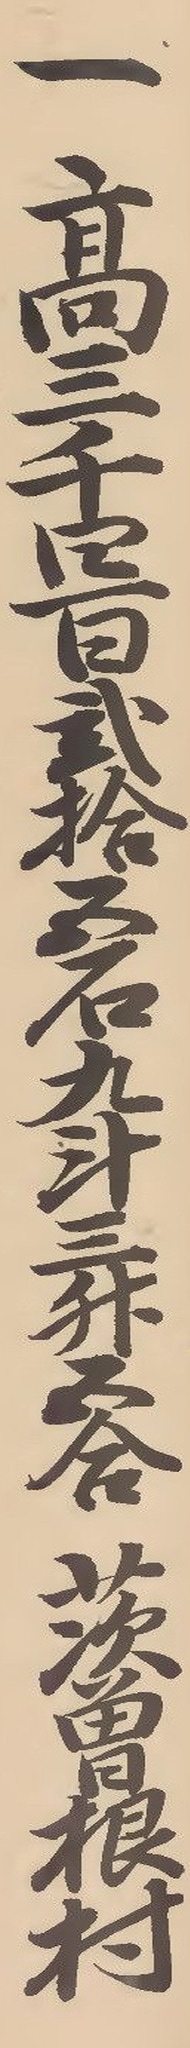一高三千四百弐拾五石九斗三升五合茨曽根村
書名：越後国郷帳　下
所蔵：国立公文書館 National Archives of Japan
